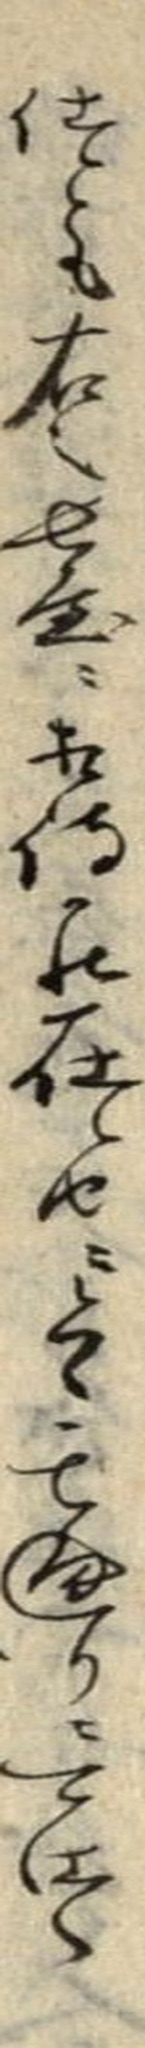仕候とも右之長屋に相伝罷在候由に候はゝ其通りに仕候
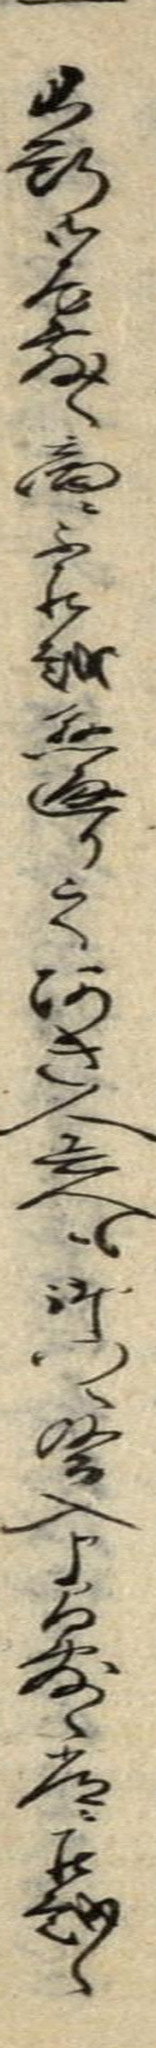一不断御屋敷へ商に不罷越懸通り之あき人壱人も御門へ堅入申間敷候常に罷越候
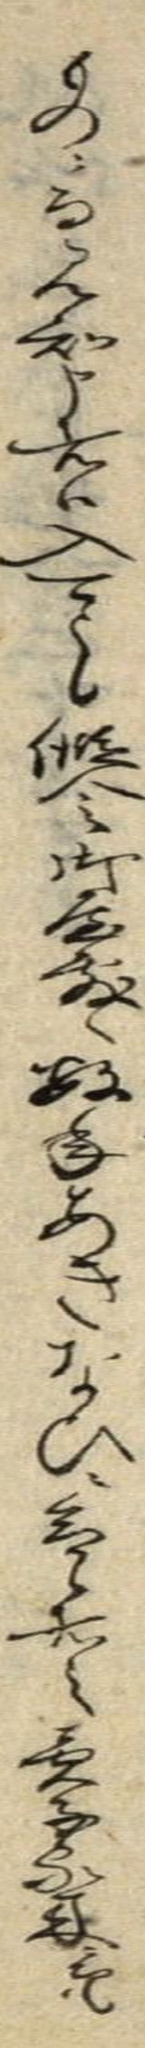ものにて見知申者は入可申候縦令御屋敷へ数年あきなひに参候者之売子家来にても
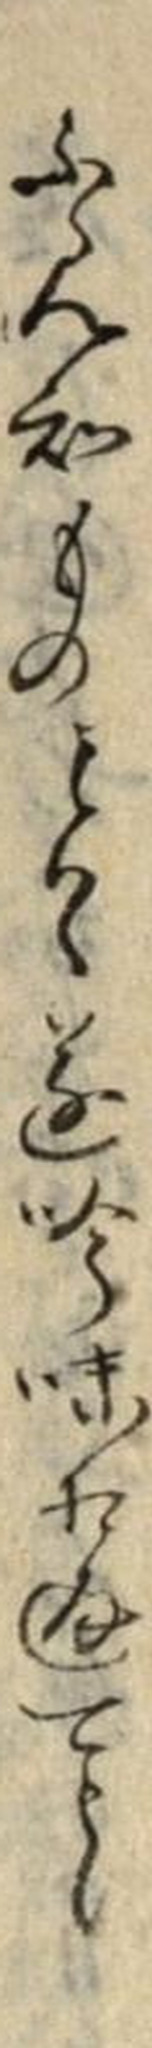不見知ものに候はゝ遂吟味可申候

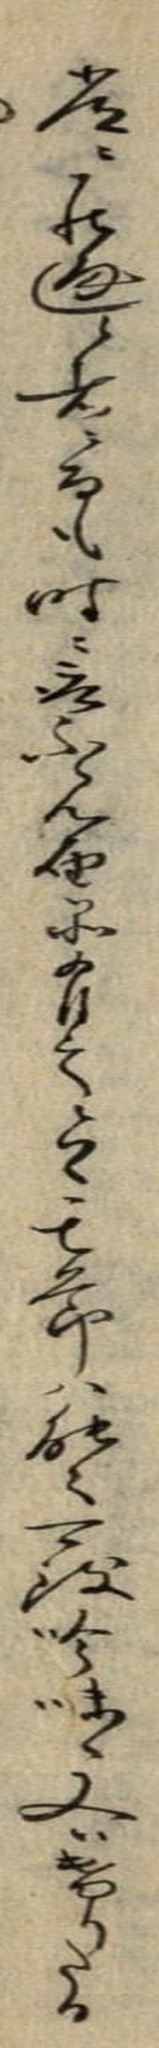一常に罷通候者にても時に取不見届品有之候はゝ其節は能々可致吟味候又は替りたる
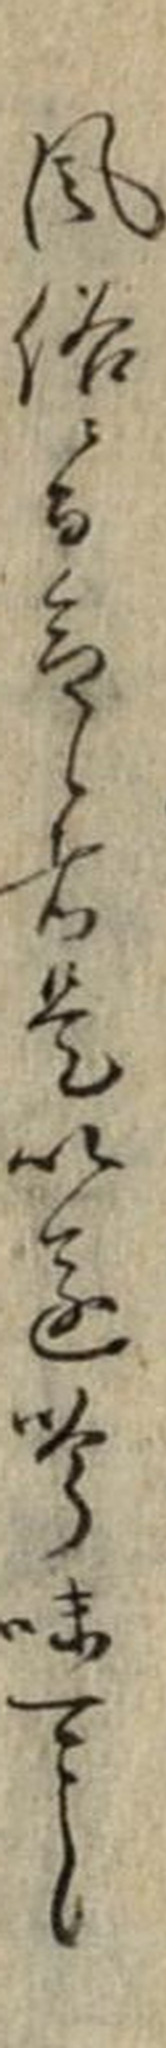風俗にて参候者是以遂吟味可申候
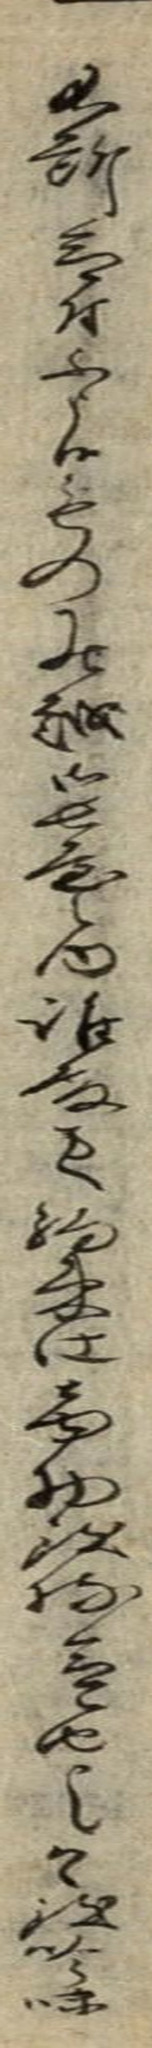一不断参付不申候もの罷越御長屋之内誰殿方へ約束仕商物致持参候由申候はゝ致吟味
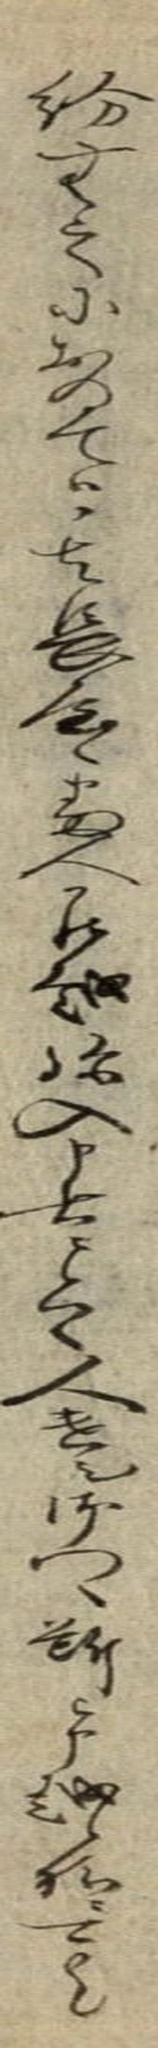紛無之におゐては其長屋へ番人罷越弥入申者に候はゝ人遣し御門へ断被申越候様に可申候
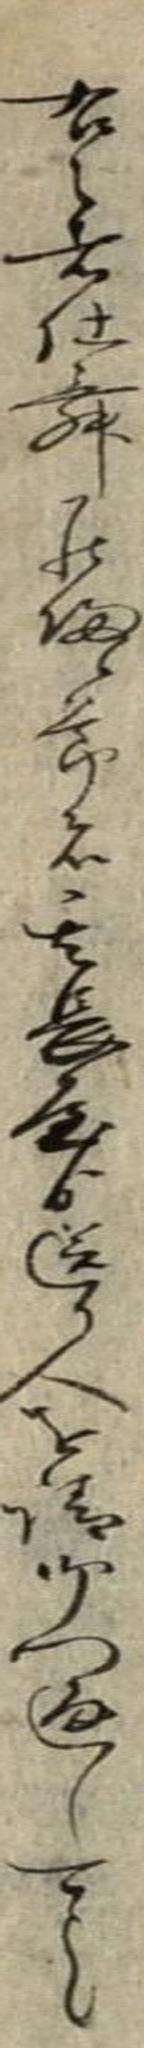右之者仕舞罷帰候節は其長屋ゟ送り人を請御門通し可申候
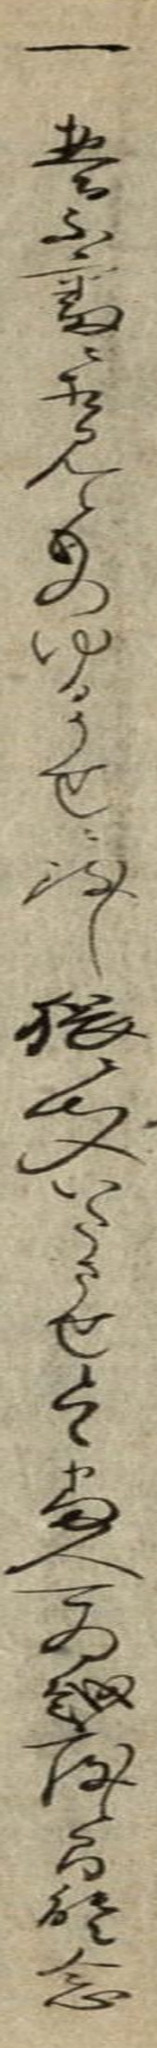一惣て不審に相見候ものゆるかせに致し猥に出入いたさせ候はゝ番人可為越度候間能々念
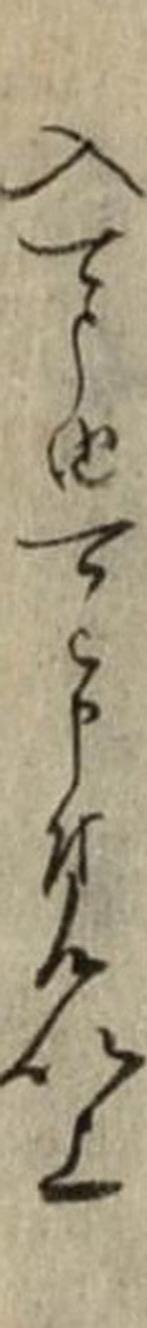入可申由可被申付候以上
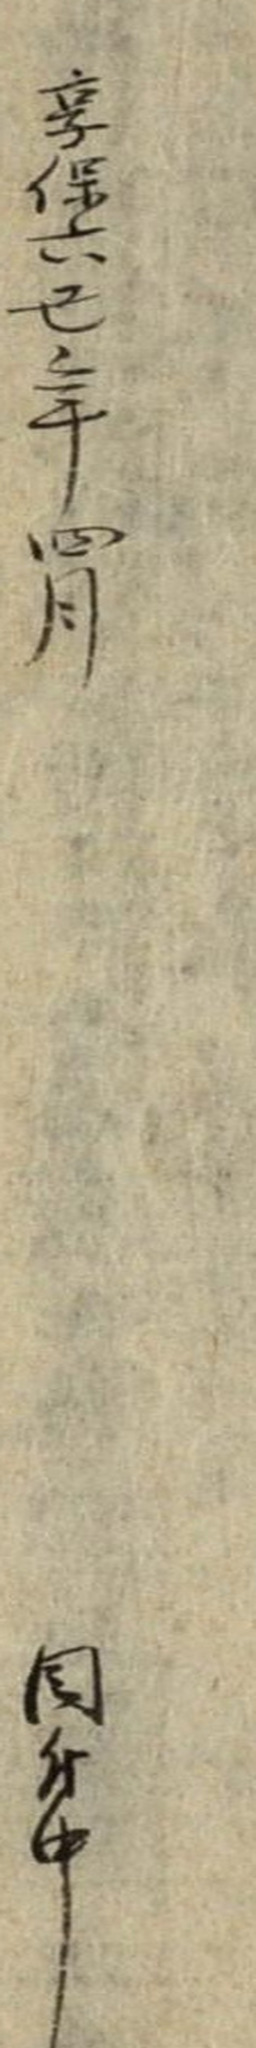享保六丑年四月目付中
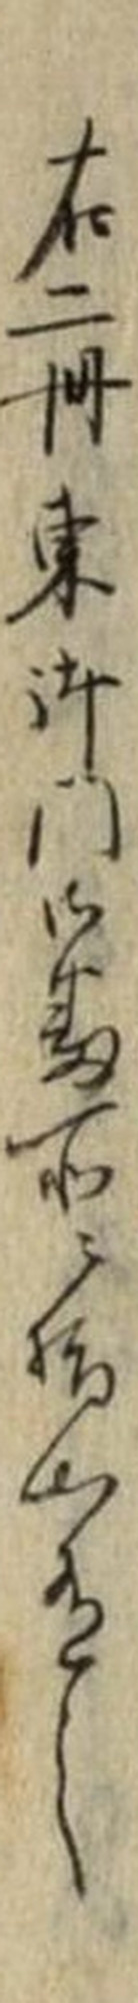右二冊東御門御番所に指出有之
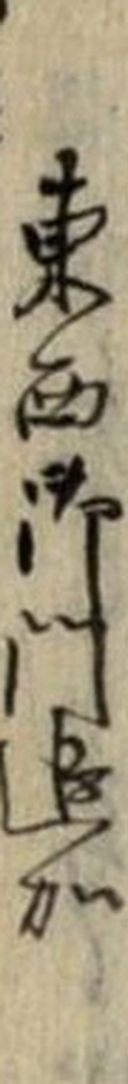東西御門追加
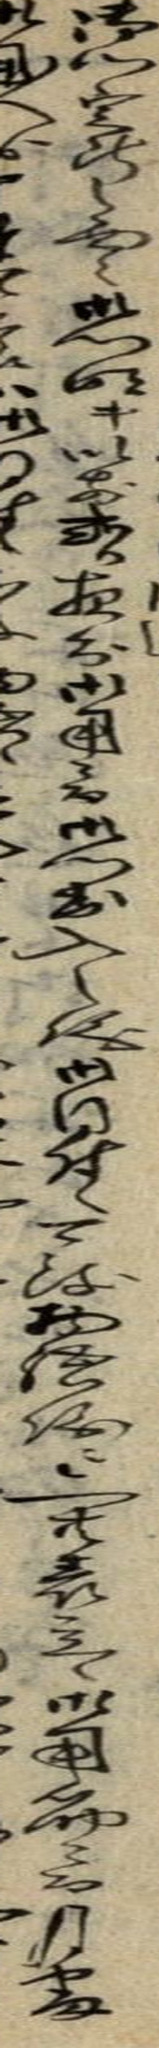〇御門定断之面々御門明き以前或は夜分御用にて御門出入之儀御目付へ可致物語儀に候へ共表立候御用筋にて月番
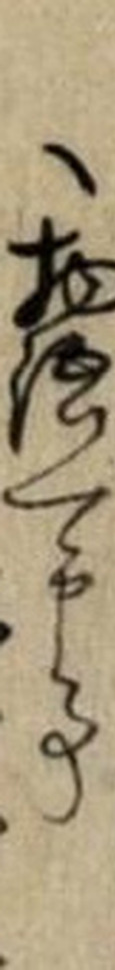へ物語可申事
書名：三都并道中之部
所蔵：福井県文書館 Fukui Prefectural Archives
